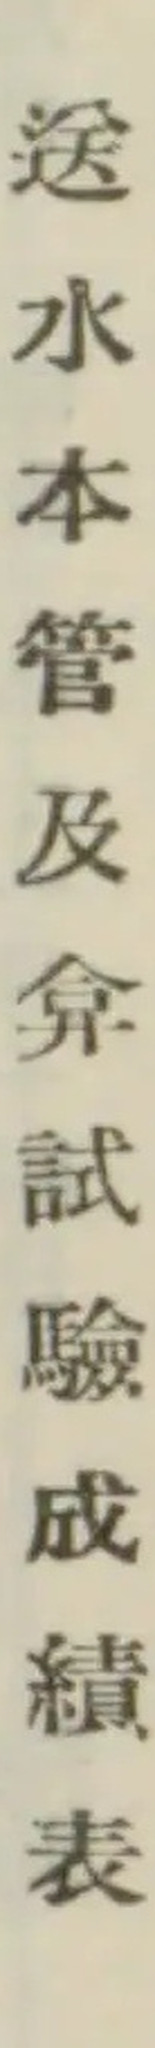送水本管及弇試験成績表
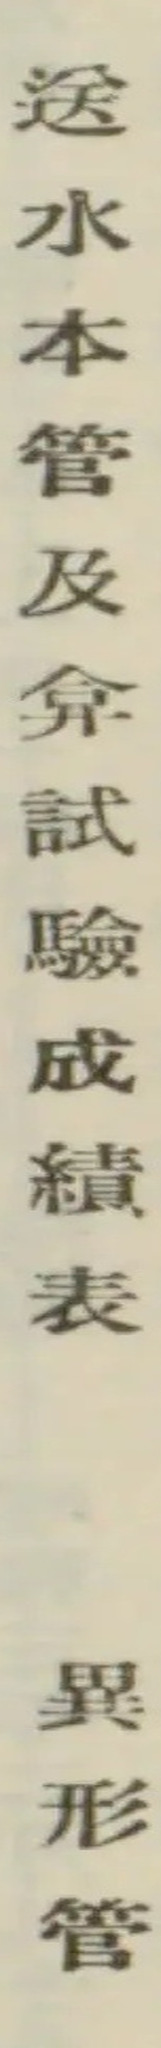送水本管及弇試験成績表異形管

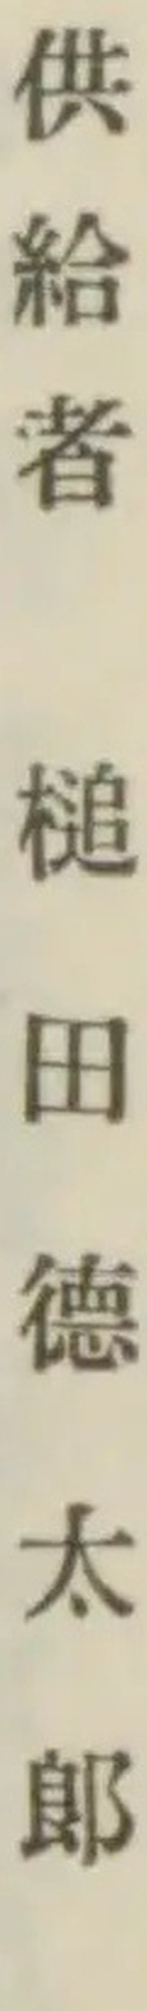供給者槌田徳太郎
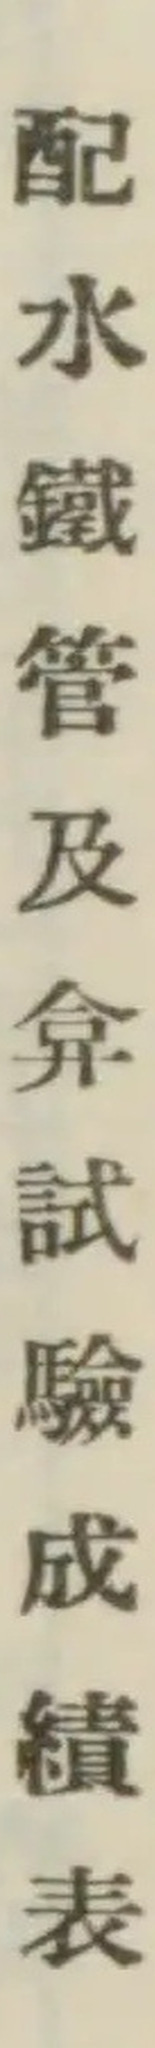配水鐵管及弇試験成績表
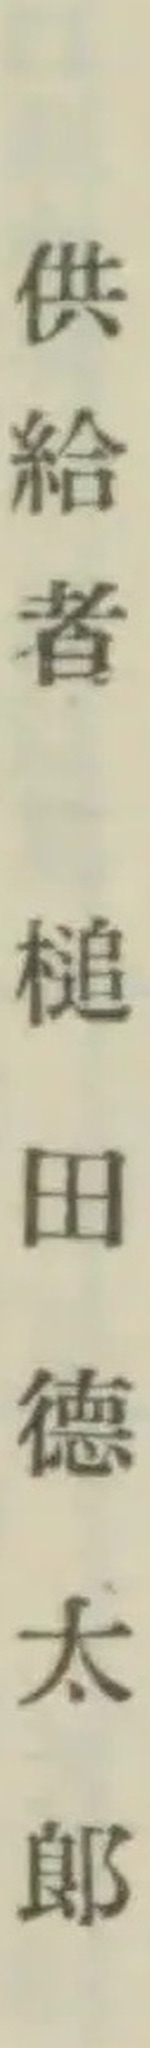供給者槌田徳太郎
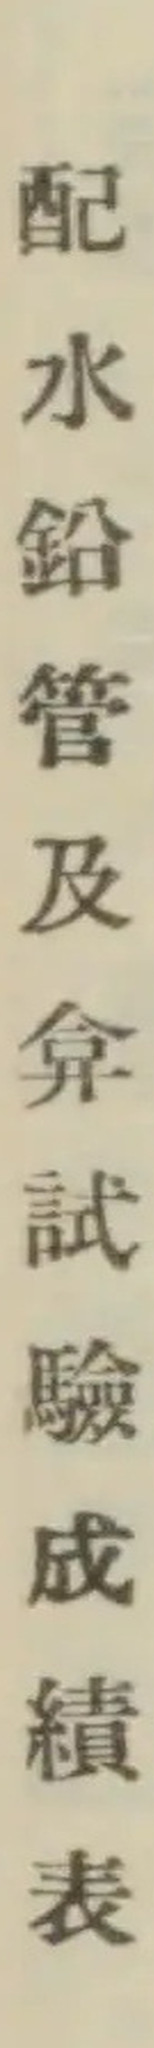配水鐵管及弇試験成績表
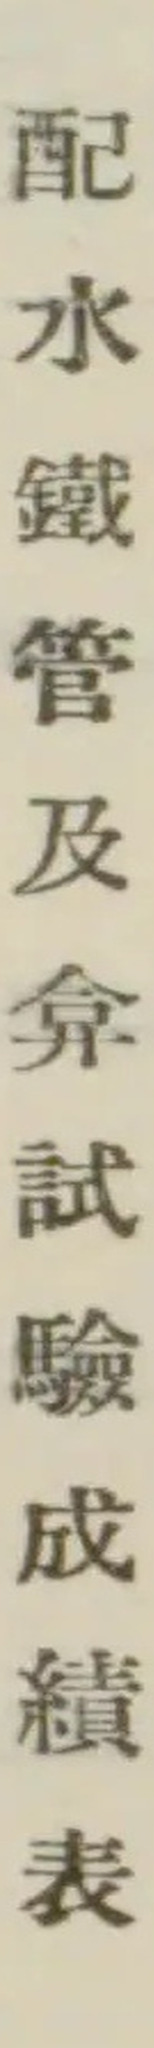配水鐵管及弇試験成績表

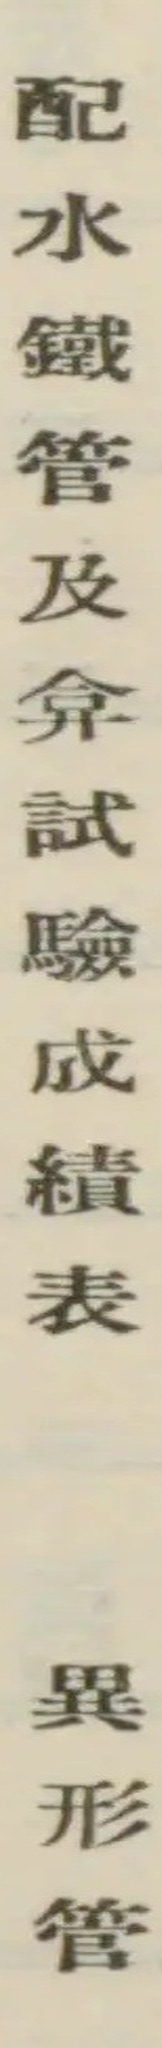配水鐵管及弇試験成績表異形管
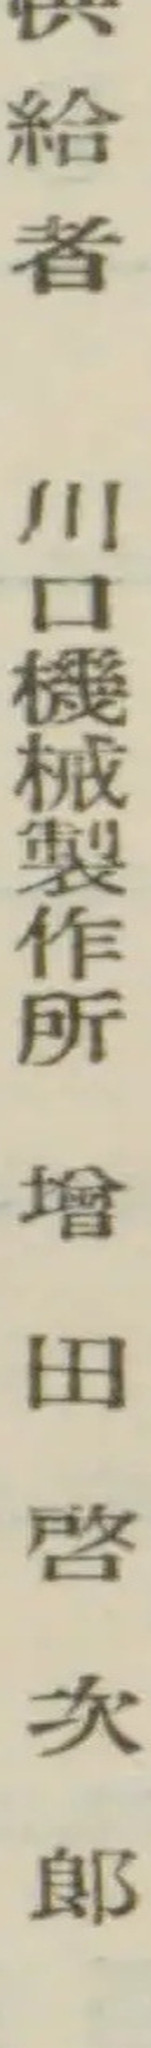供給者川口機械製作所増田啓次郎
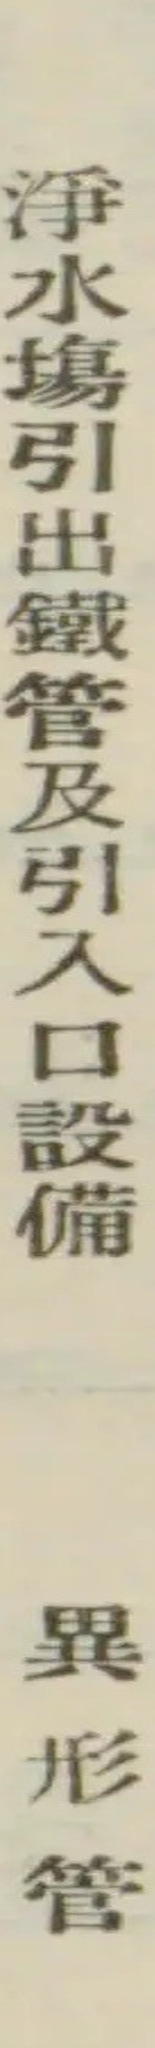浄水場引出鐵管及引入れ口設備異形管

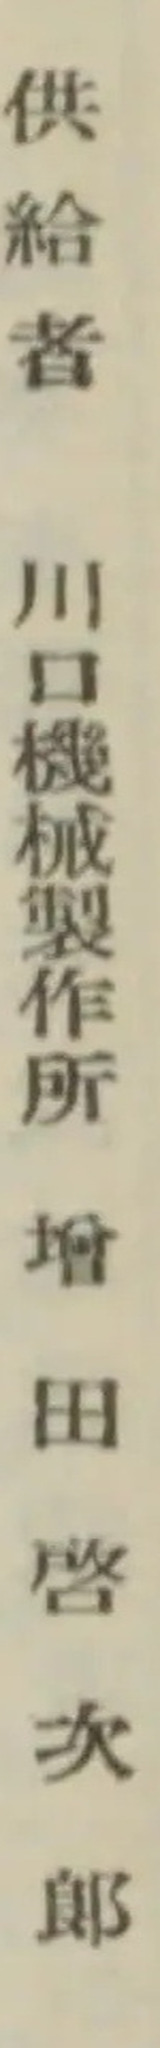供給者川口機械製作所増田啓次郎
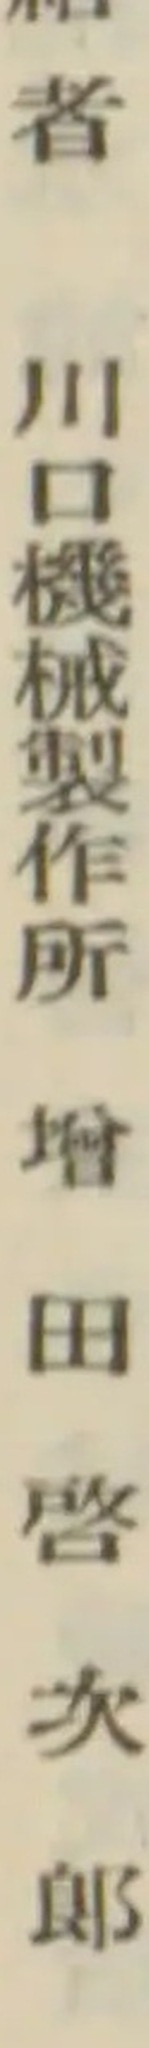供給者川口機械製作所増田啓次郎

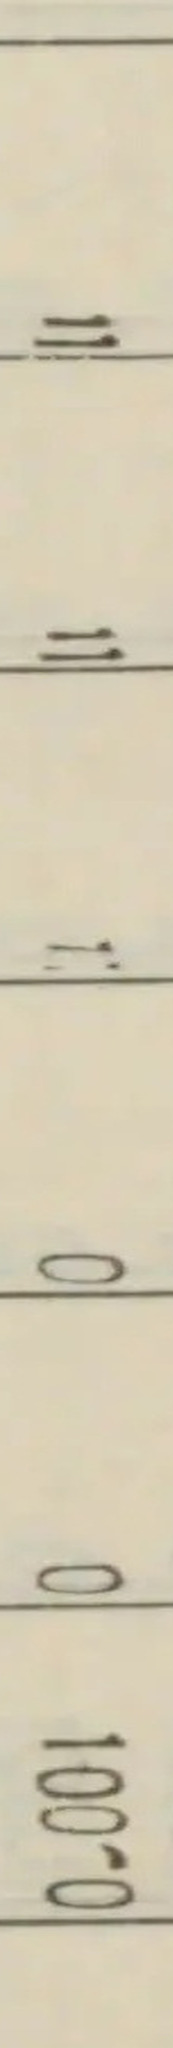帽一一一〇〇一〇〇、〇〇〇
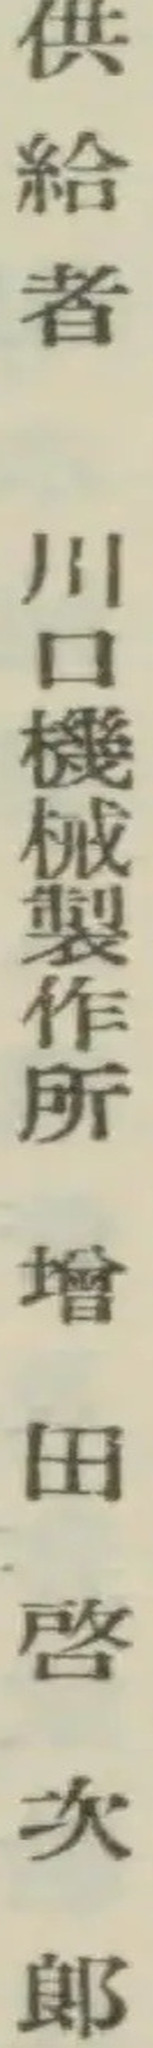供給者川口機械製作所増田啓次郎
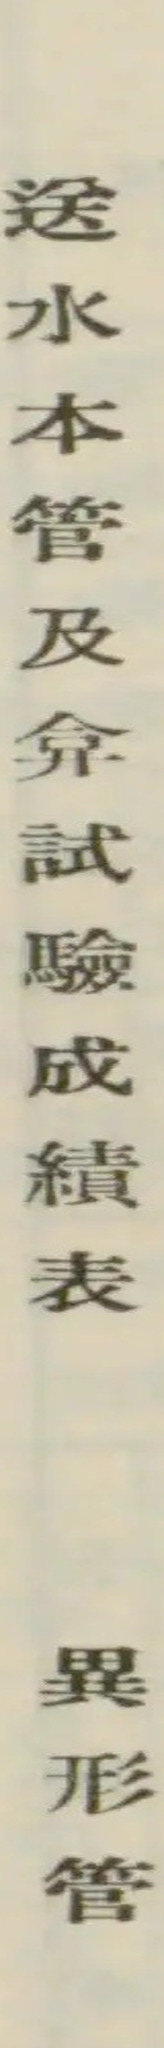送水本管及弇試験成績表異形管

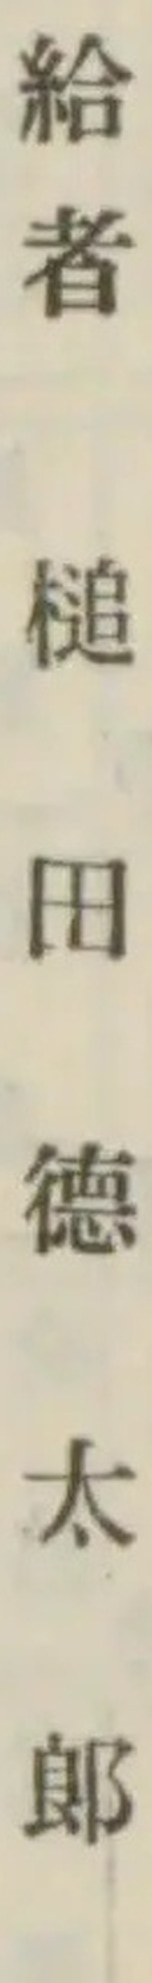供給者槌田徳太郎
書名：豊橋市水道誌
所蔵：国立国会図書館 National Diet Library, JAPAN
